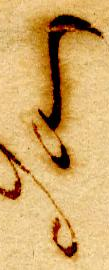To
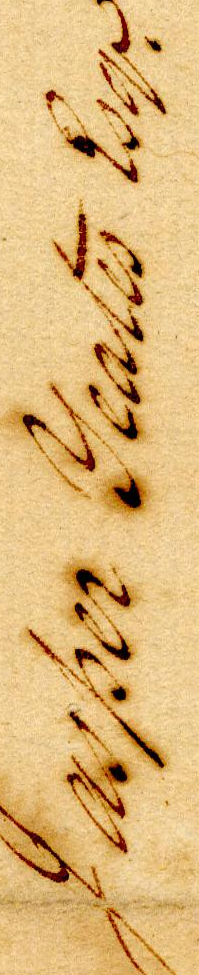Jasper Yeates Esq^r.
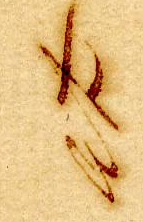at
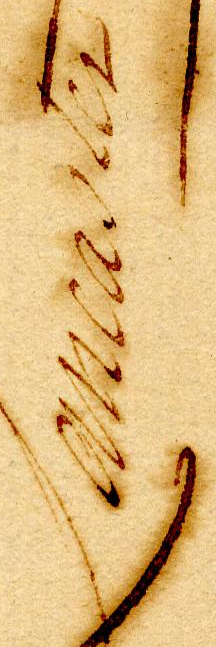Lancaster
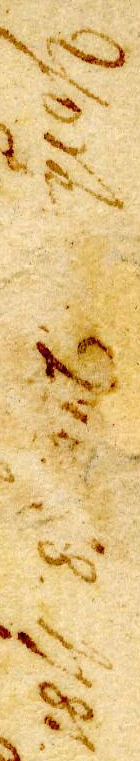York. Dec. 18. 1781.
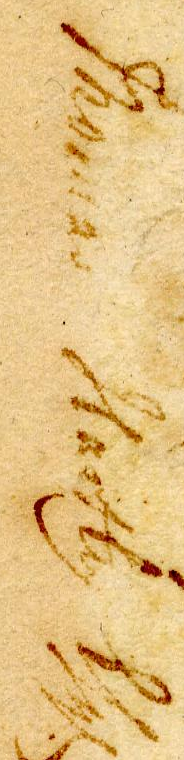Thomas Hartley Esq^r.
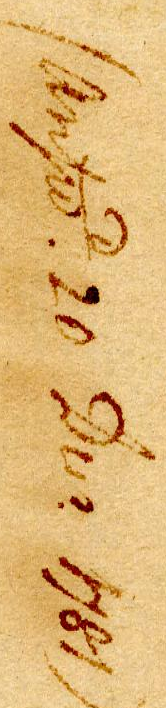(Answ^d 20 Dec^r. 1781)
